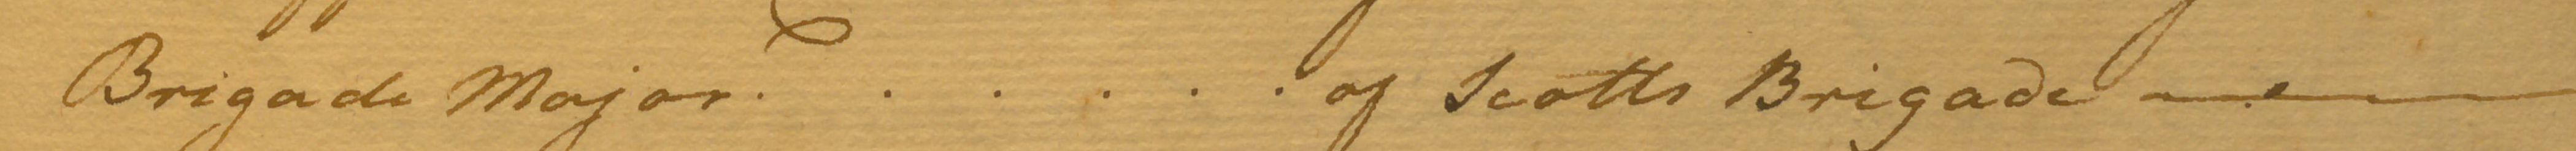Brigade Major. ..... of Scotts Brigade-
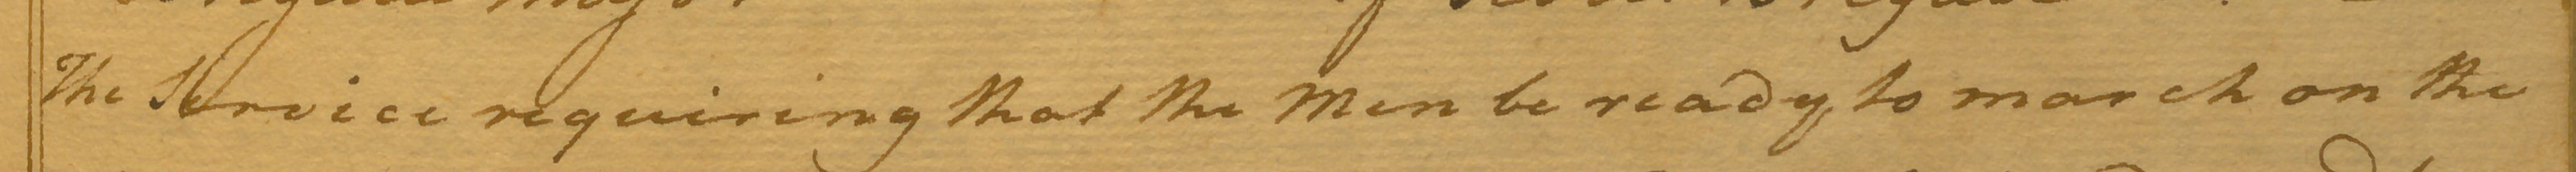The Service requiring that the Men be ready to march on the
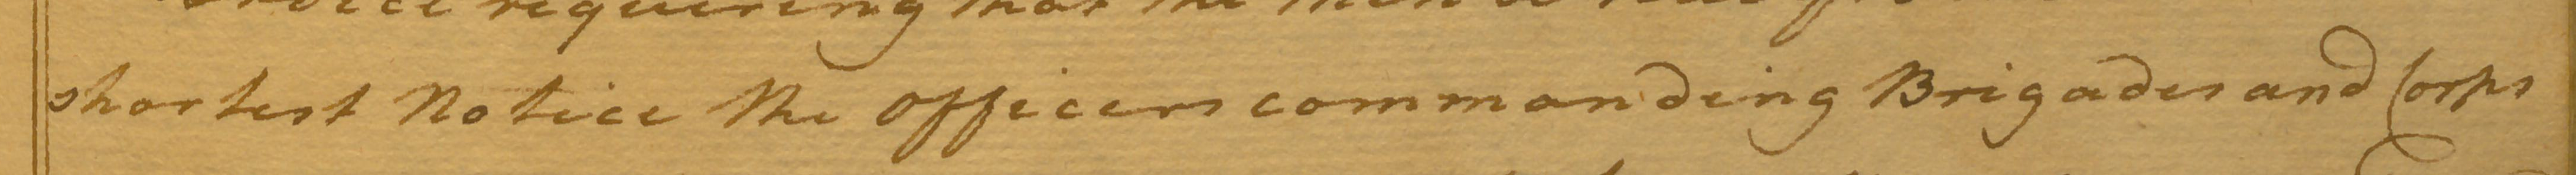shortest Notice the Officers commanding Brigades and Corps
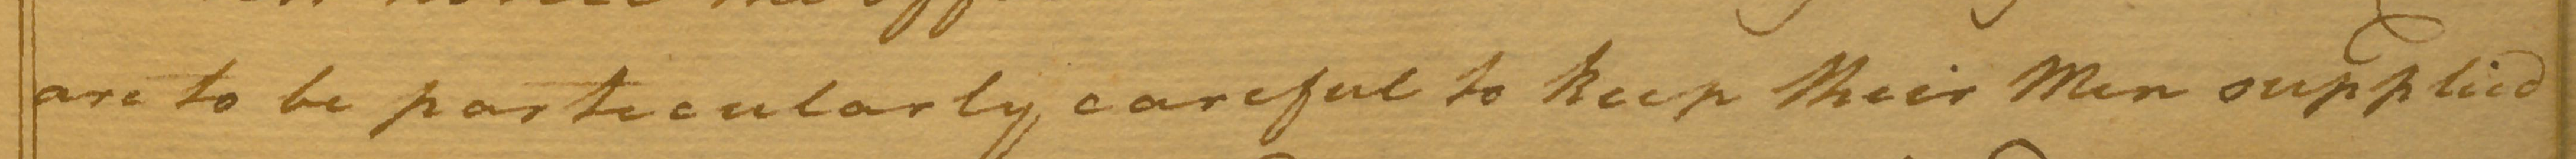are to be particularly careful to keep their Men supplied
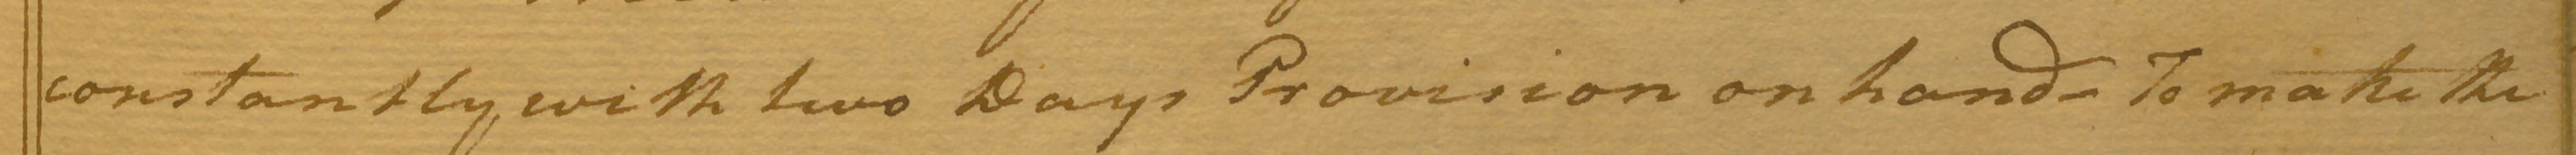constantly with two Days Provision on hand- To make the
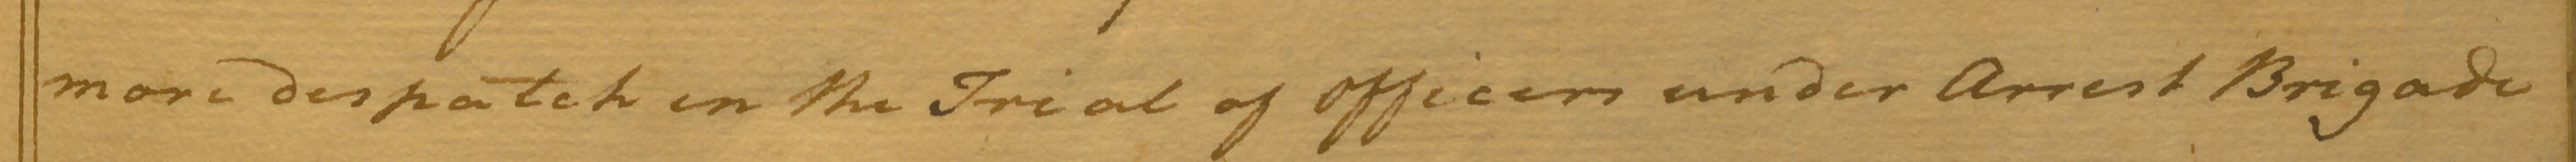more despatch in the Trial of Officers under Arrest Brigade
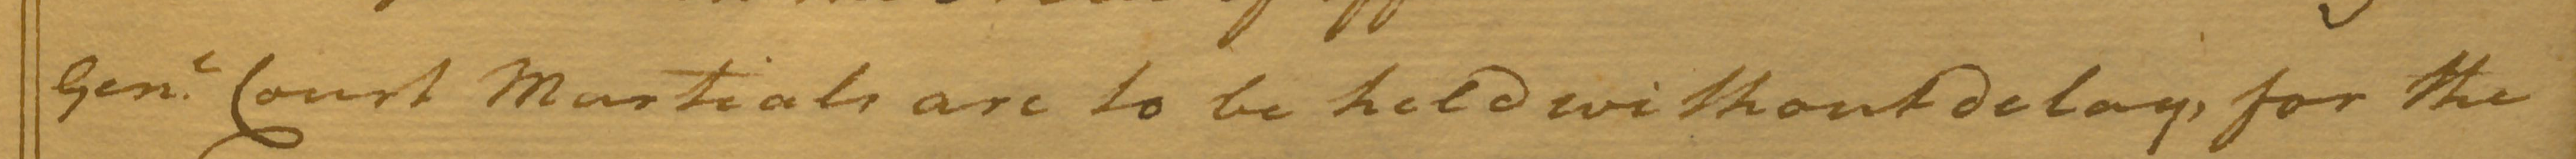Gen^l Court Martials are to be held without delay, for the
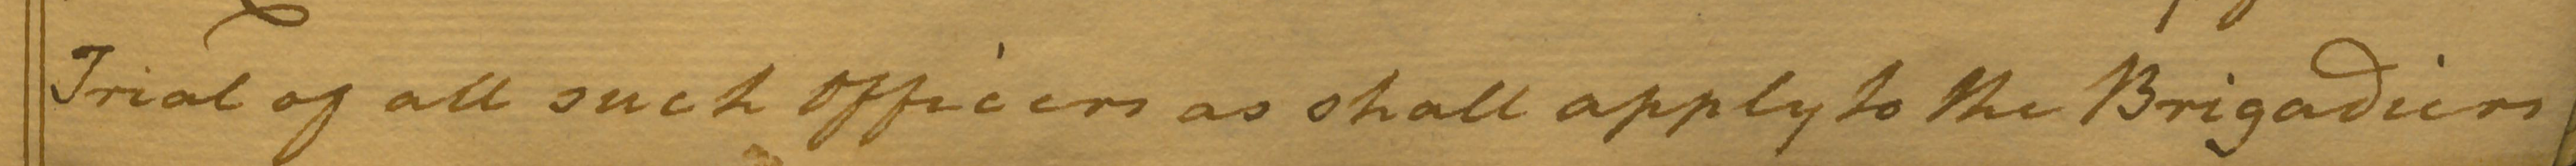Trial of all such Officers as shall apply to the Brigadiers
